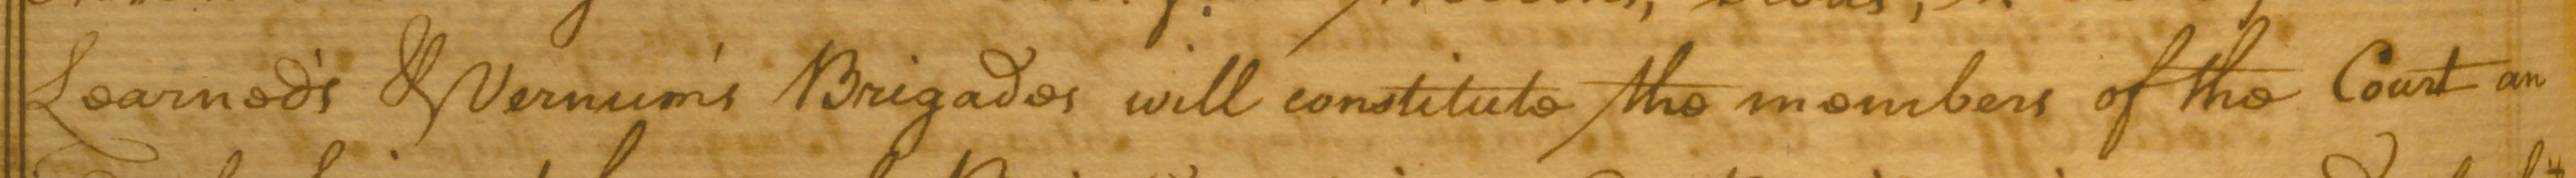Learned's & Vernums Brigades will constitute the members of the Court an
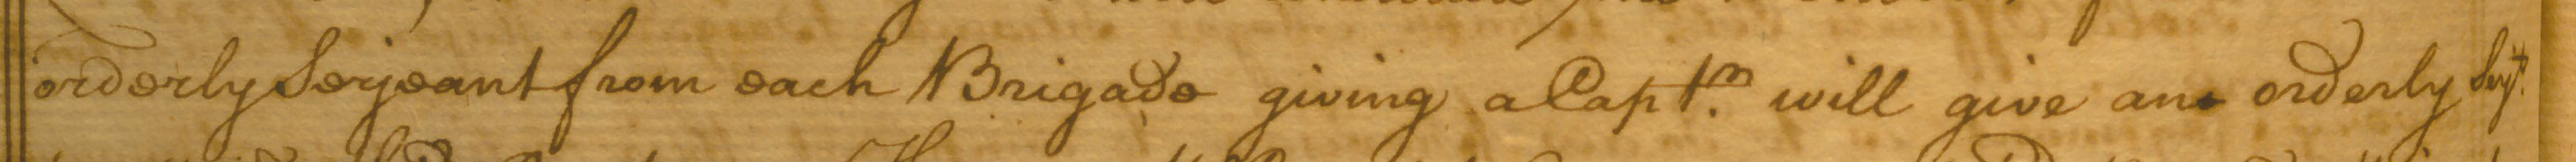orderly Serjeant from each Brigade giving a Capt^n. will give an orderly Serj^t.
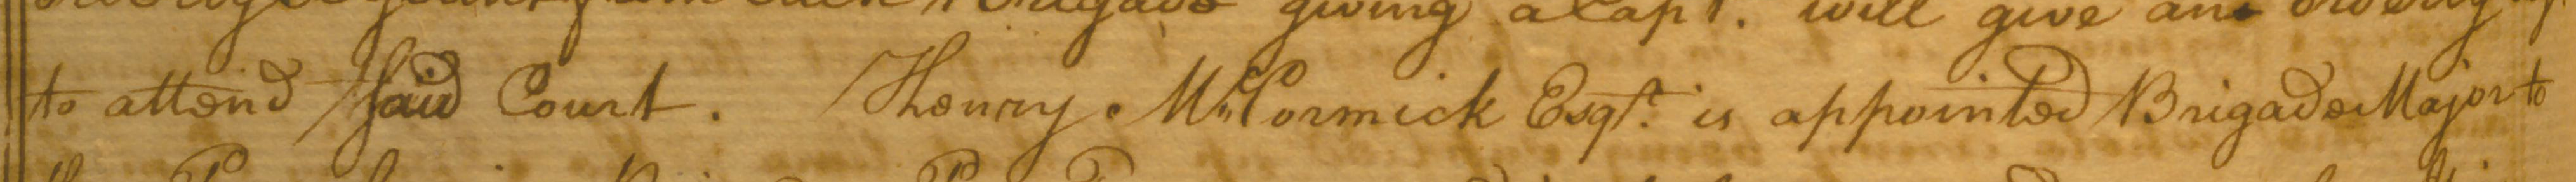to attend said Court. Henry M^c.Cormick Esq^r. is appointed Brigade Major to
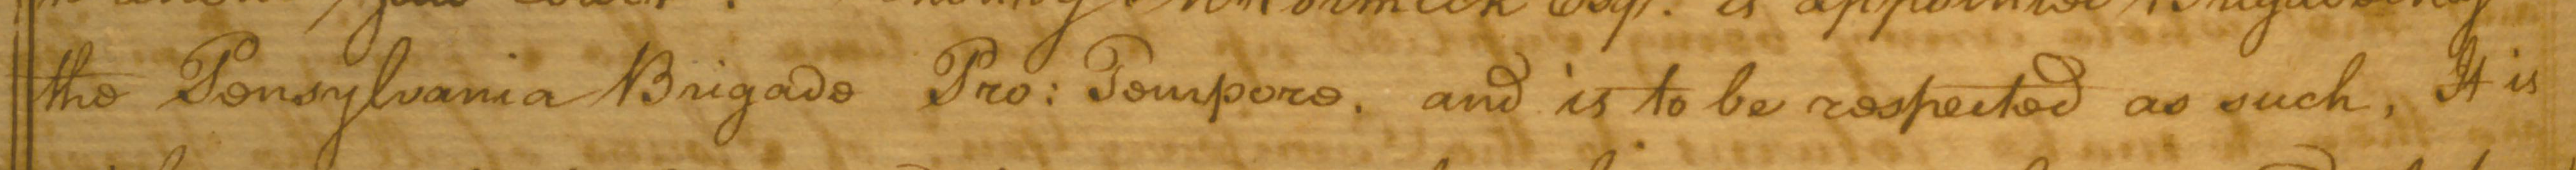the Pensylvania Brigade Pro: Tempore. and is to be respected as such. It is
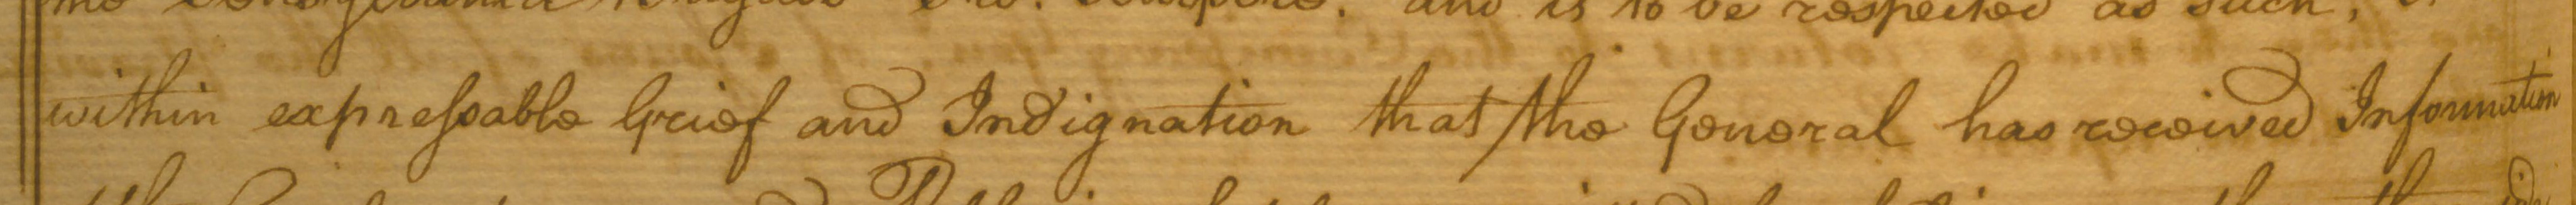within expressable Grief and Indignation that the General has received Information
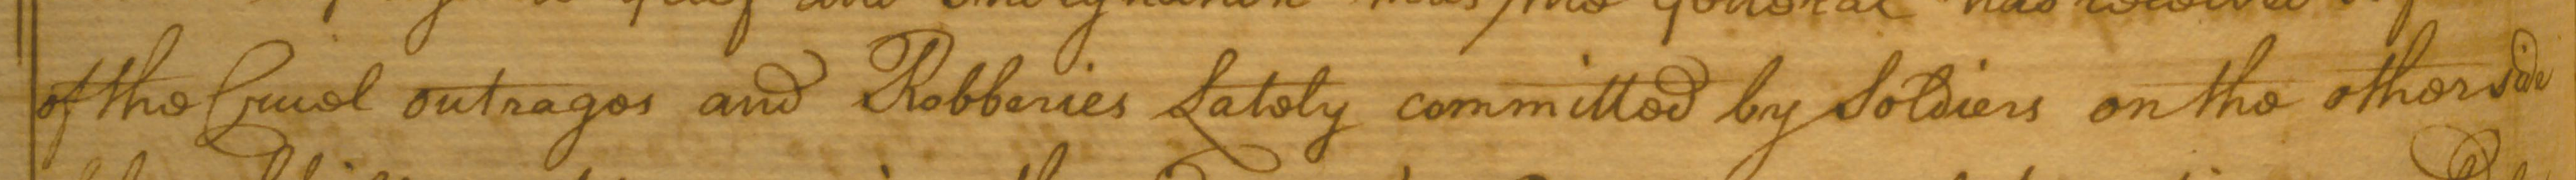of the Cruel outrages and Robberies Lately committed by Soldiers on the other side
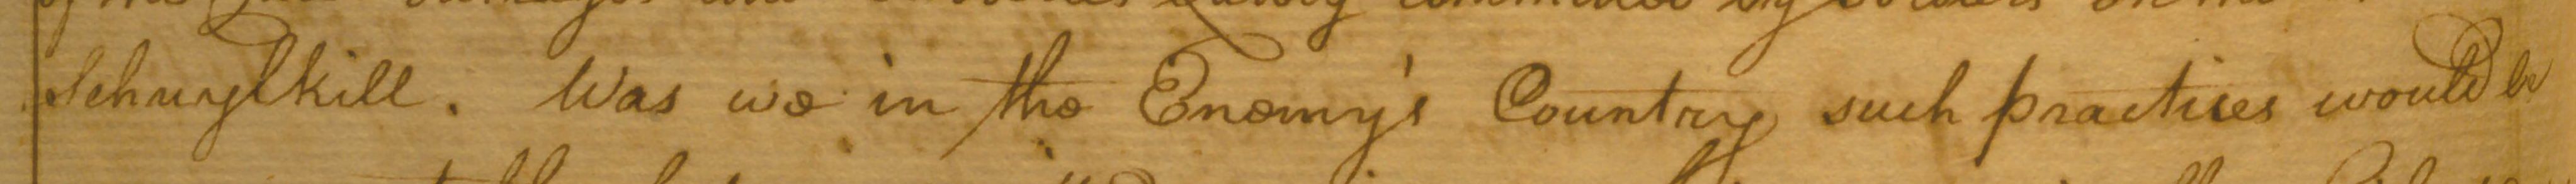Schuylkill. Was we in the Enemy's Country such practices would be
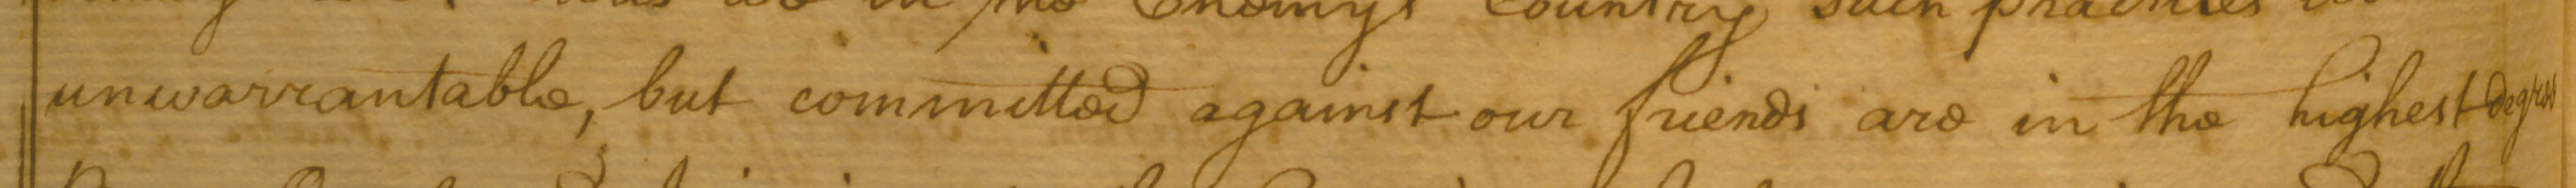unwarrantable, but committed against our friends are in the highest degree
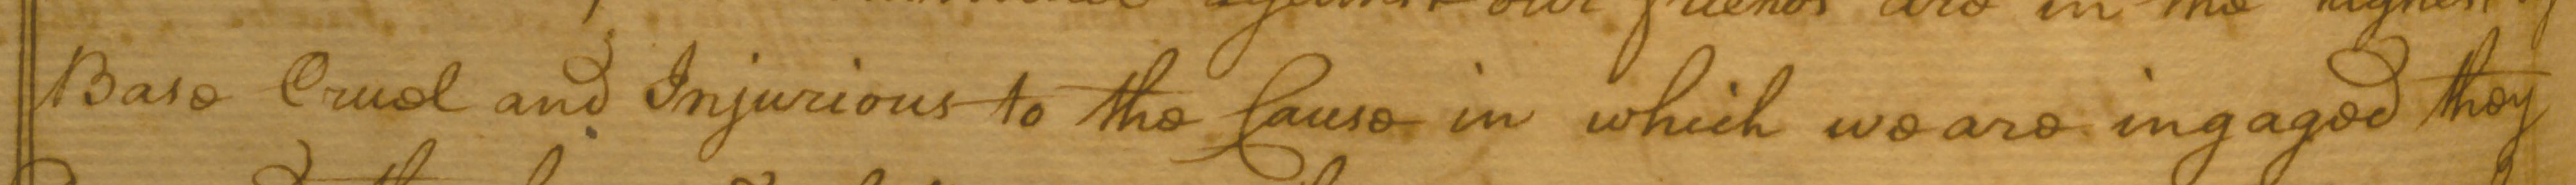Base Cruel and Injurious to the Cause in which we are ingaged they
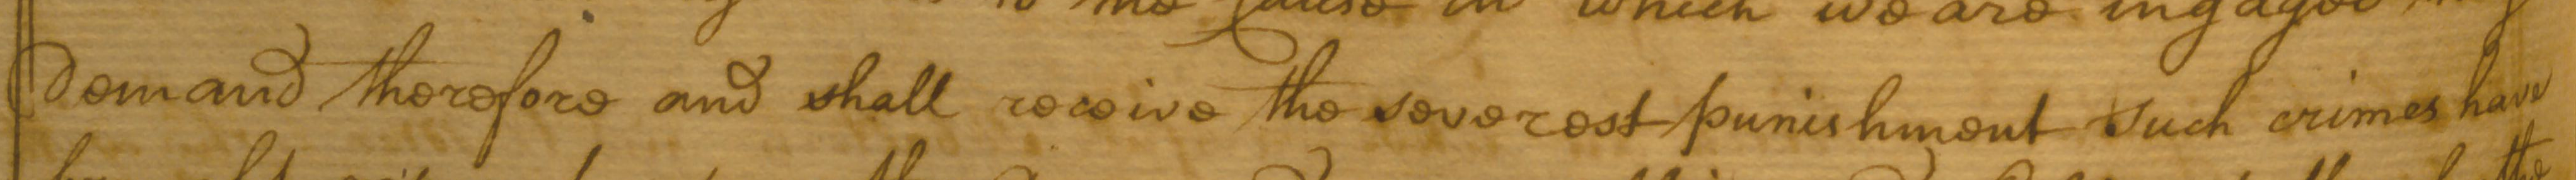demand therefore and shall receive the severest punishment such crimes have
